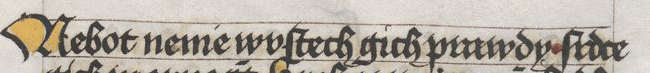Nebot nenie wvſtech gich prawdy.ſrdce
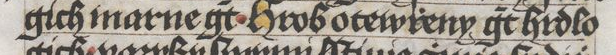gich marne ḡt.Hrob otewṙeny ḡt hrdlo
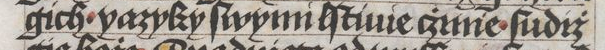gich.yazyky ſwymi lſtivie cżinie.ſudiż
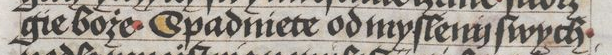gie boże.Spadniete od myſlenij ſwych.
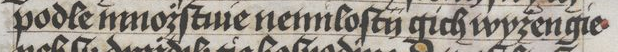podle mnożſtvíe nemiloſtij gich wyżen gie.
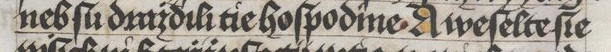neb ſu drażdili tie hoſpodine.A weſelte ſie
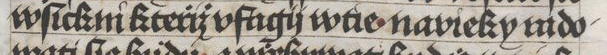wẛickni kteṙiż ufagij wtie.navieky rado¬
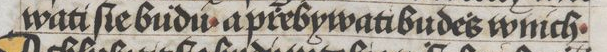wati ſie budu.a pṙebywati budeš wnich.
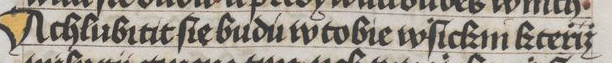A chlubitit ſie budú w tobie wẛickni kteṙíż
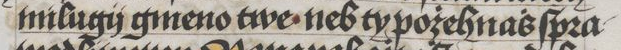milugij gmeno twe.neb ty pożehnaṡ ſpra¬
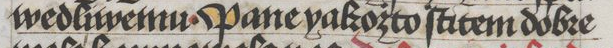wedliwemu.Pane yakożto ẛtitem dobre
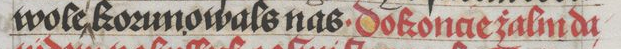wole korunowals nas.Dokoncie żalm da¬
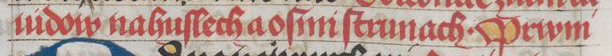vidow na huſlech a oſmi strunach.Prwní
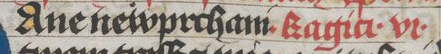Ane newprchaní.kagíci.vi.
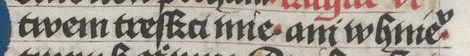twem treſtzci mie.ani whniev.
